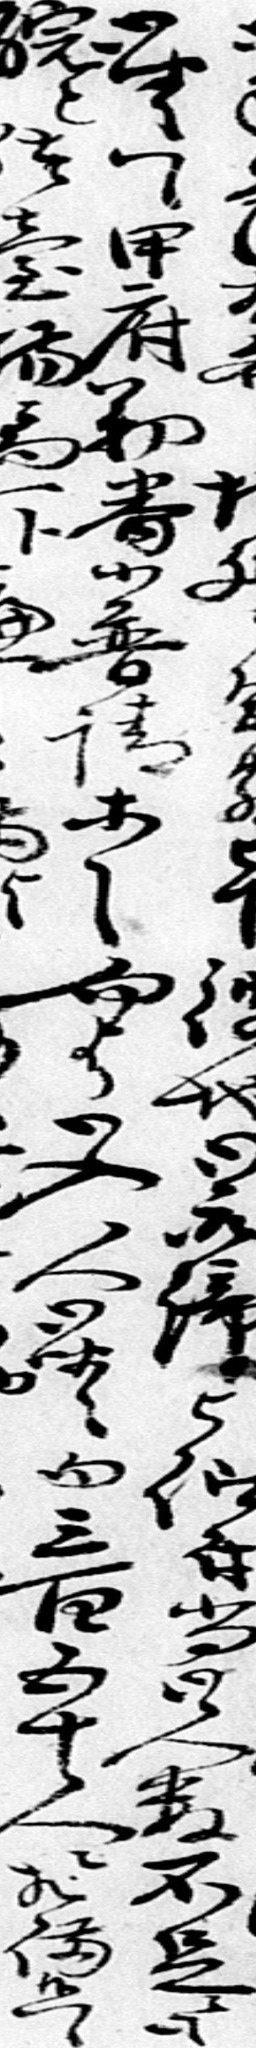御座候はゝ甲府勤番小普請等之向より御入人御座候而三百五十に相備候はゝ
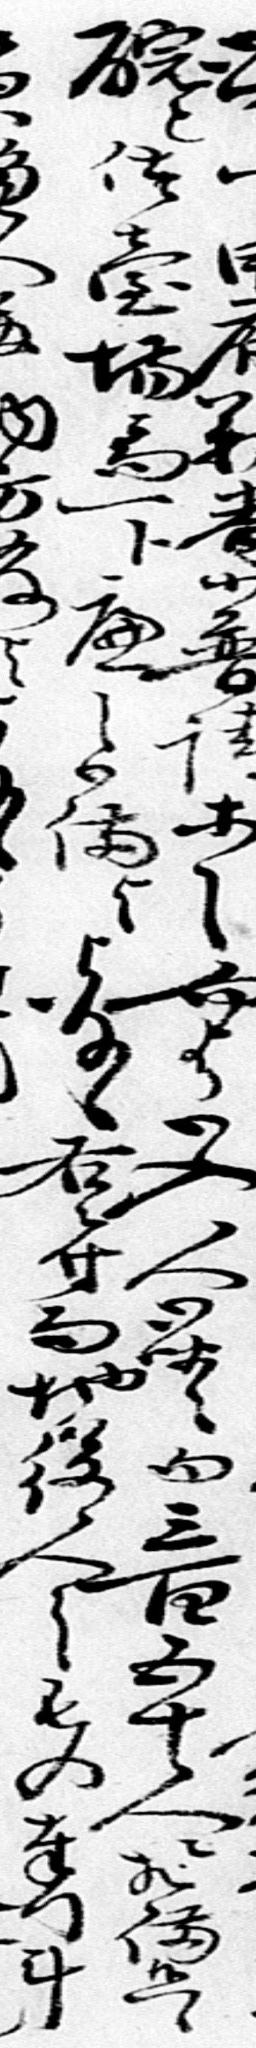聢と仕候台場に而一と通之御備と被存候右に付而地役人之もの奉行計
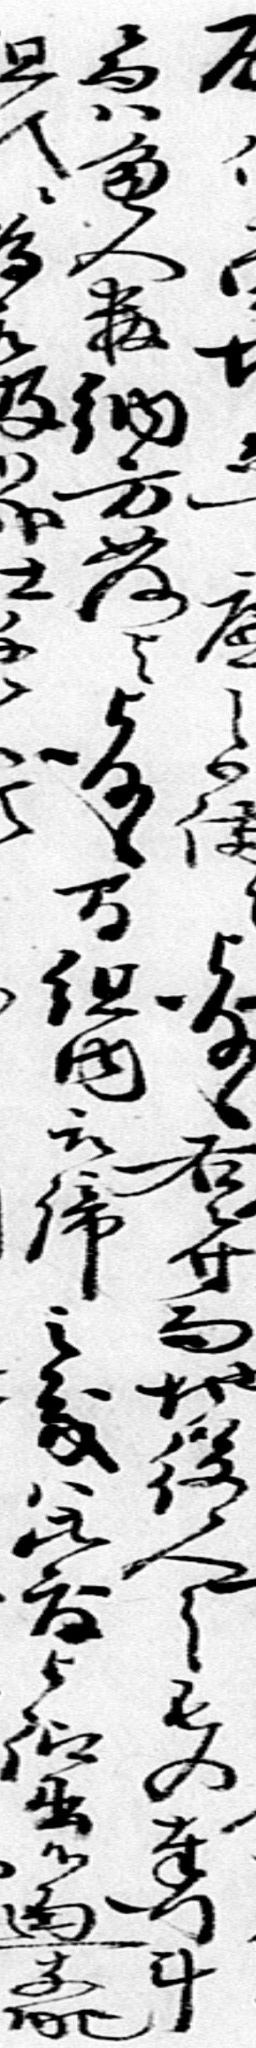に而は多人数納方如何と被存候間組内取締之義は此度被仰出候通支配
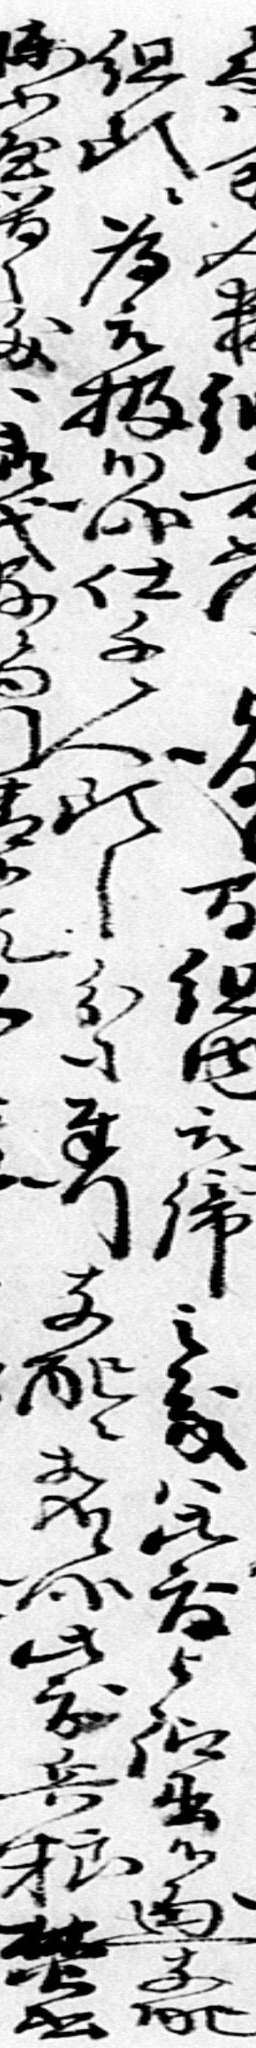組頭に為取扱候様仕千人頭之分も奉行支配に相成候様此度兵粮焚出
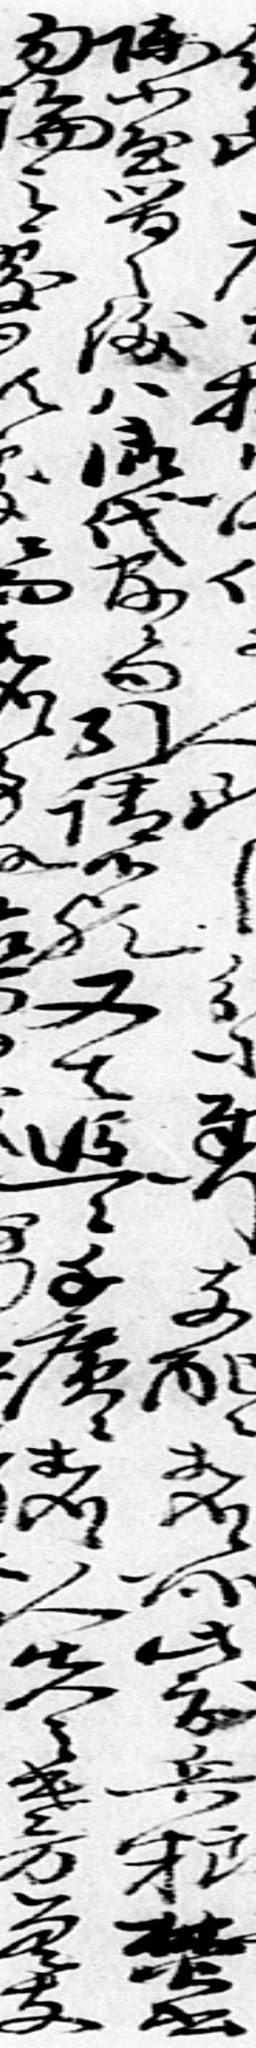陣小屋等之儀は御代官に而引請候欤又は追々手広に相成候人先之遣方差支
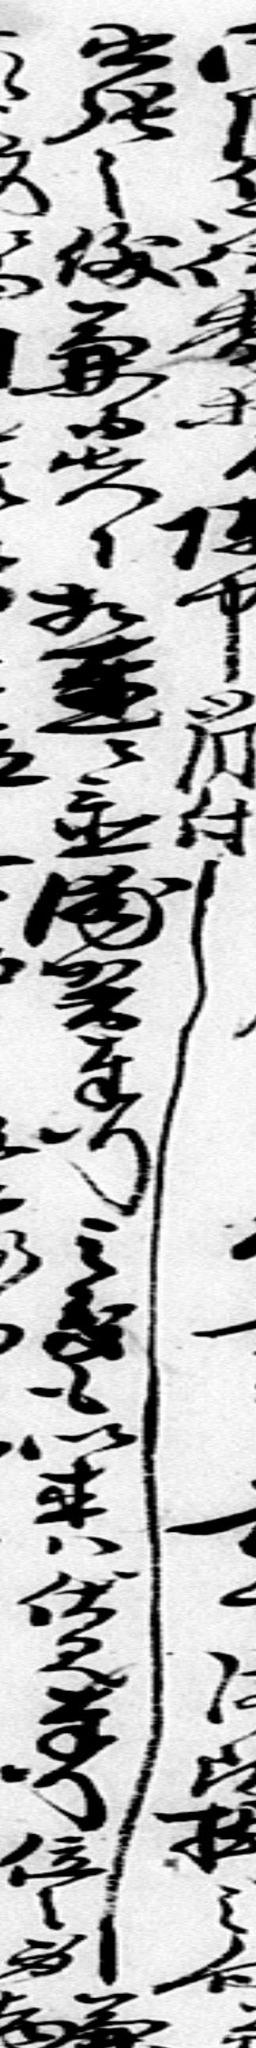出張之儀兼而先々相達被置浦賀奉行之義も以来は伏見奉行位之身柄
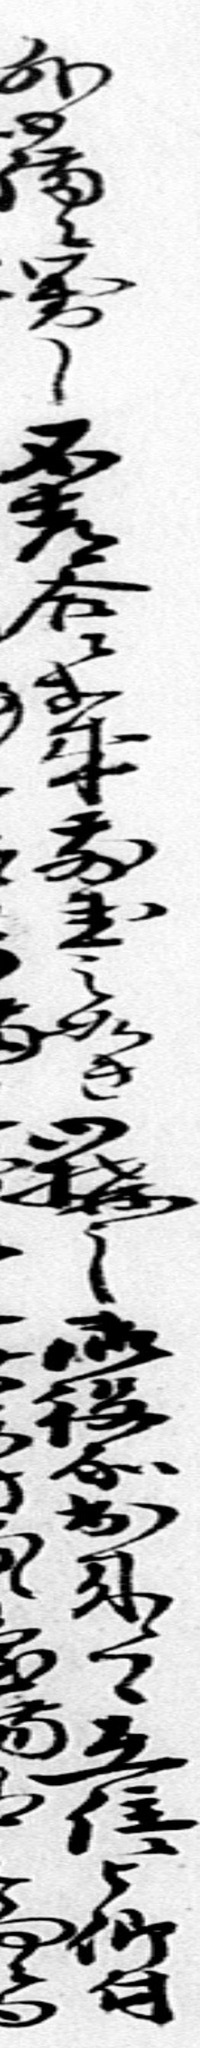外御備に対し不都合に相成前置之如き御構之御役所出来候はゝ在住に被仰付
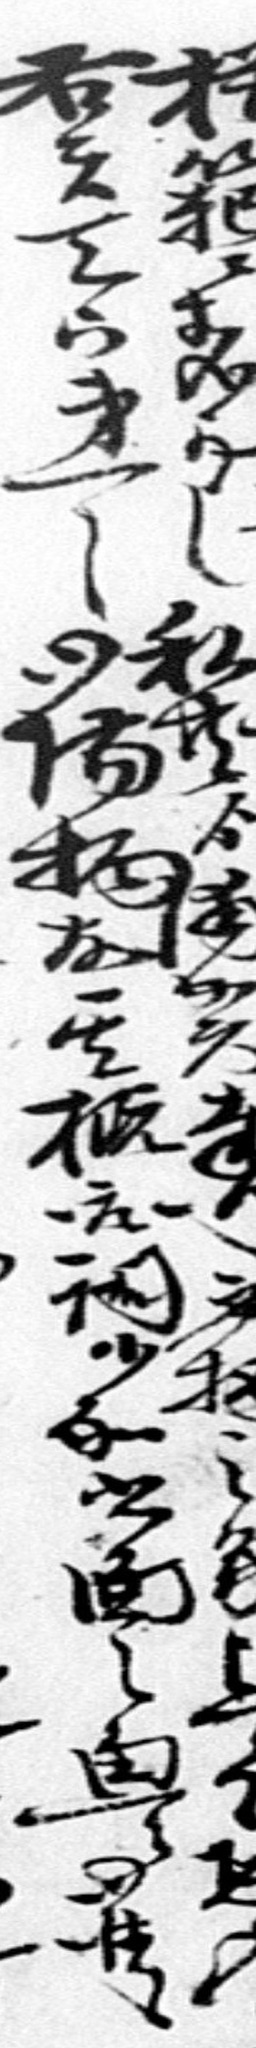右は天下第一之御場柄故其概取調候処書面之通に御座候
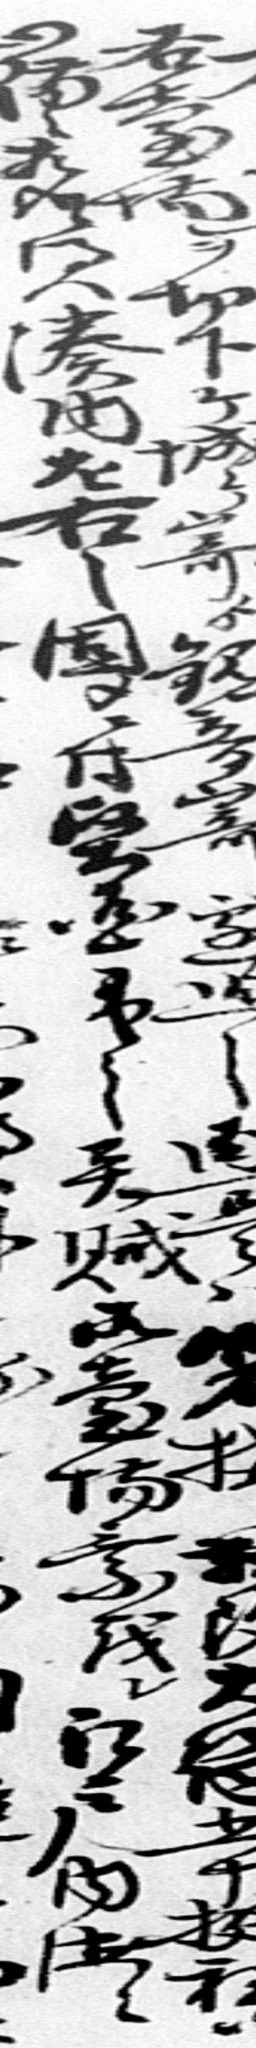御備に相成候得は湊内左右之固めに付堅固之異賊御台場乗越し江戸内海に
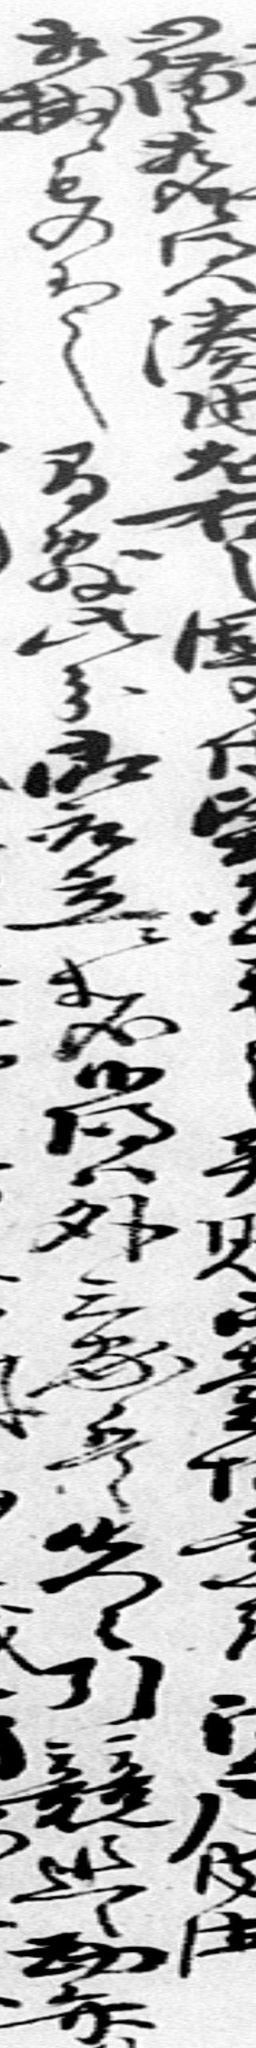相掛候もの有之間敷此分御取立に相成候得は外三処は先々引競追々勘弁も
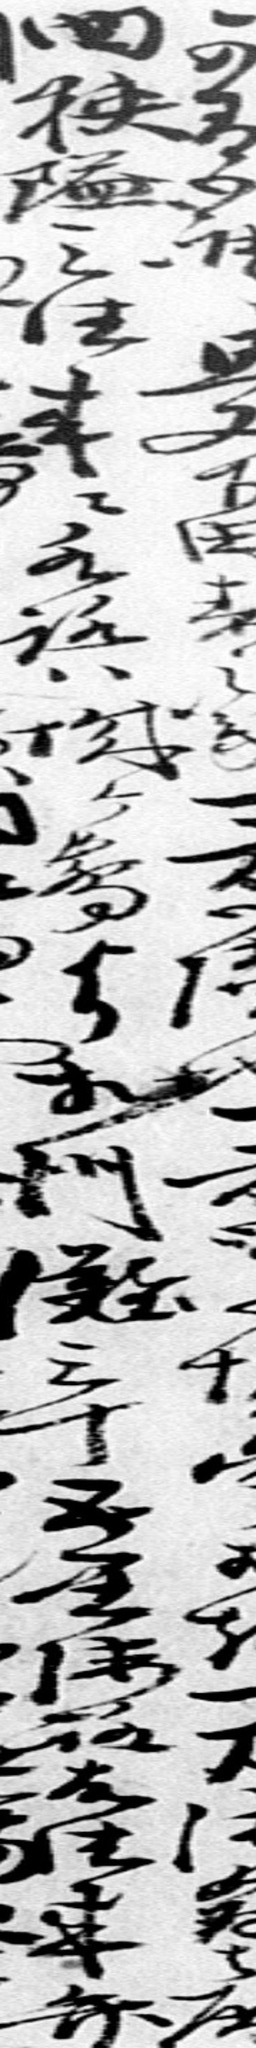曲狭隘之往来に水路は城ケ島より相州灘三十五里海路故往来弁
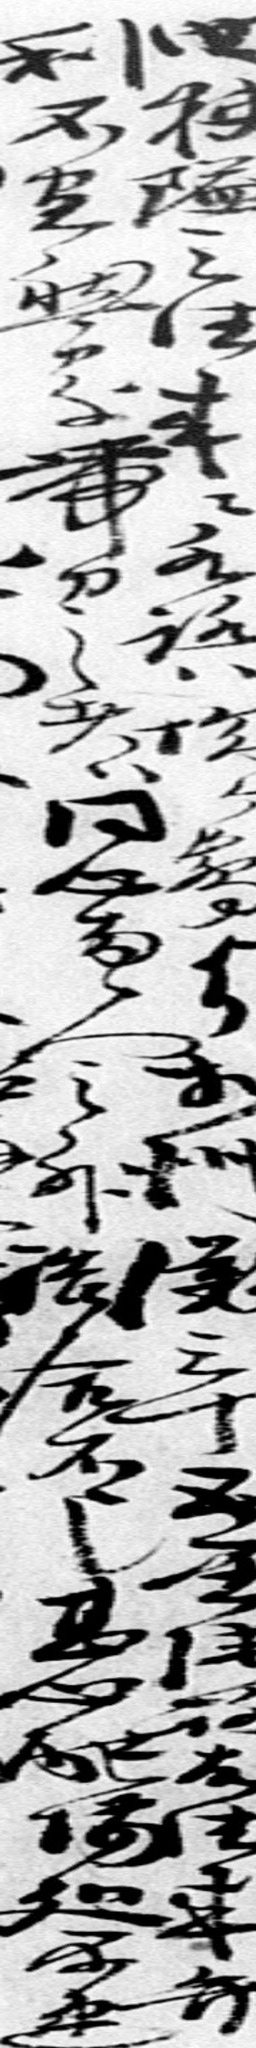利不宜然処帯刀之者は同心両人之外詰合不申甚心配場処早速
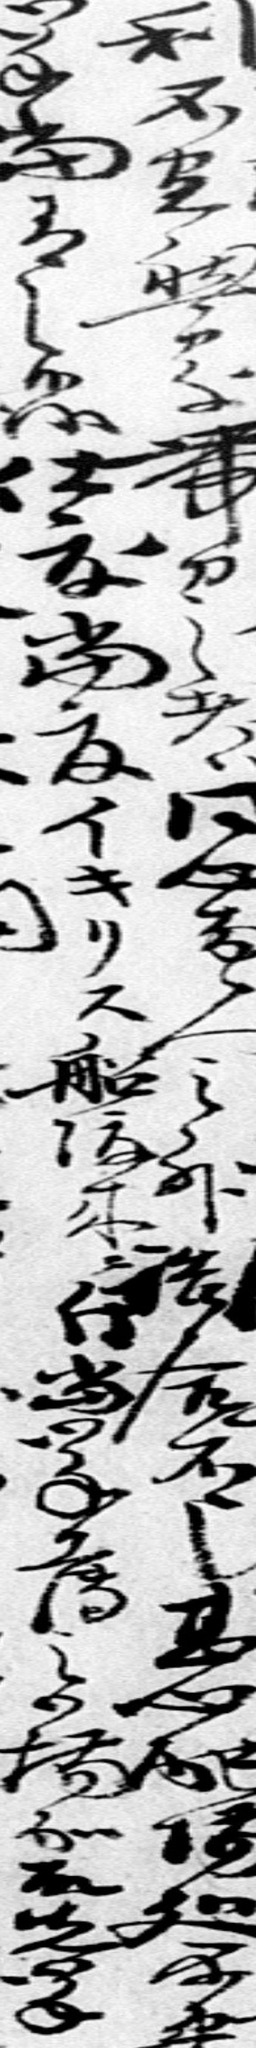御手当有之候様仕度当夏イキリス船渡来に付当御手薄之御場処故先御手
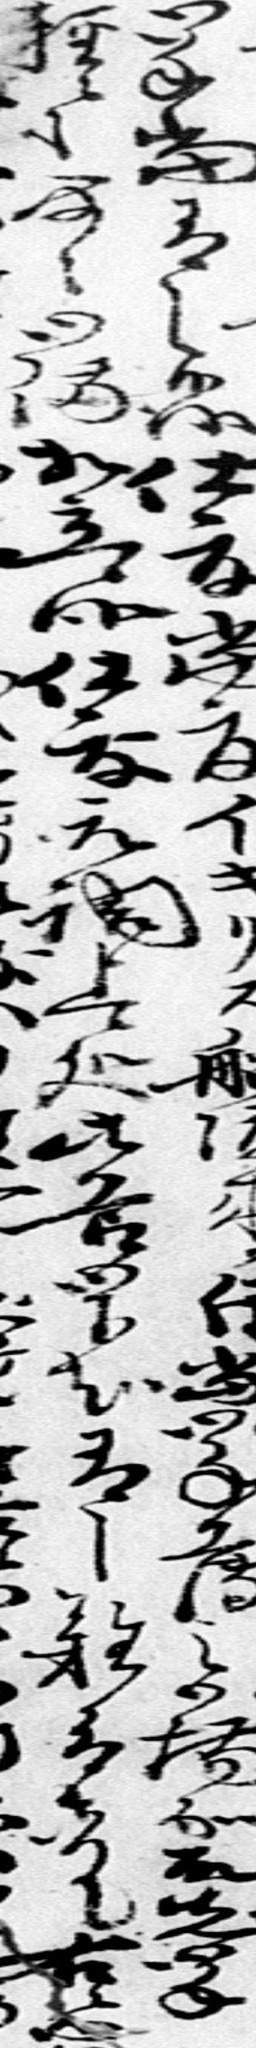軽にも存早々御備相立候様仕度取調申上候処此節御下知有之難有奉存候右之処は
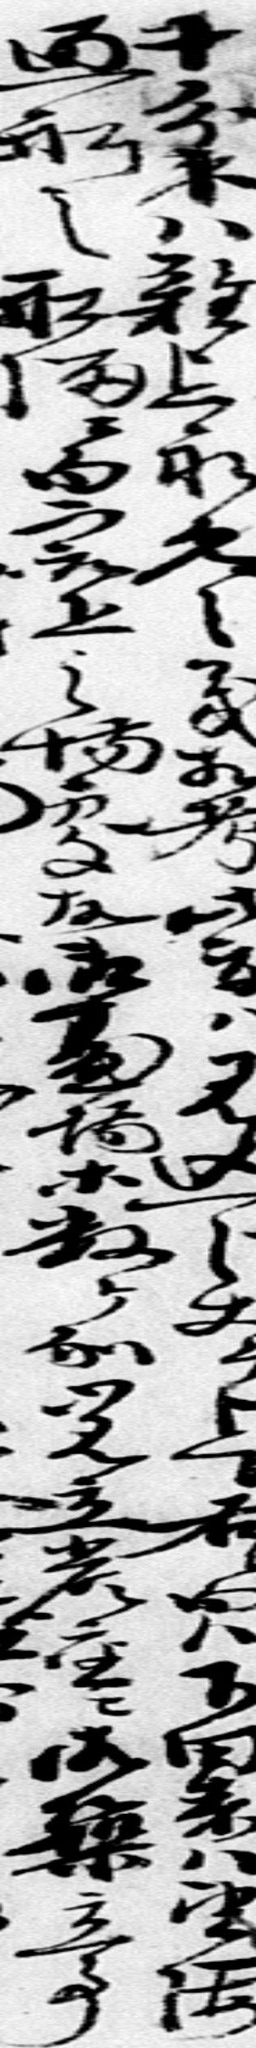通船之船溜に而最上之場処故御台場等数ヶ所御見立厳重に御築立事
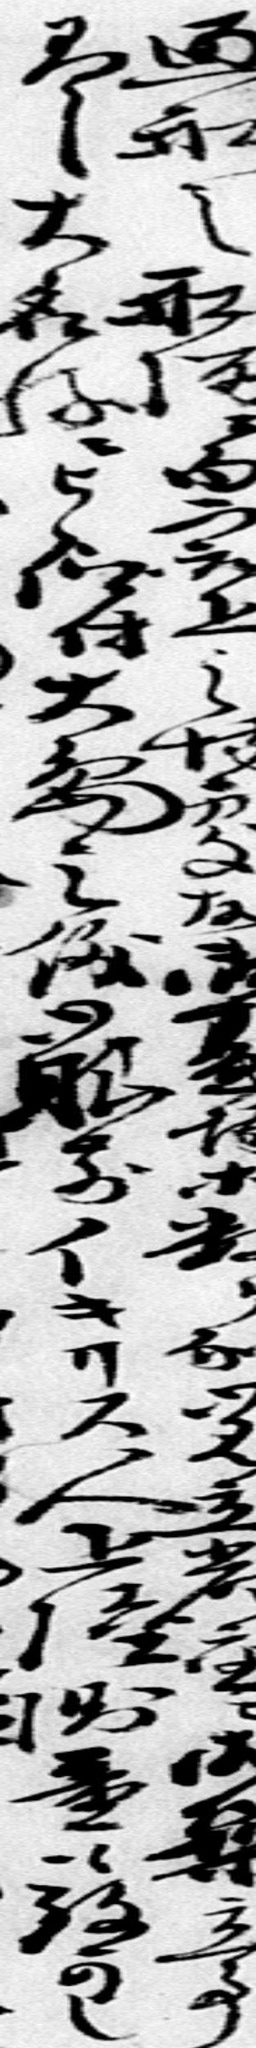有之大名様に被仰付大島之儀御船前イギリス人上陸測量も致可申
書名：浦賀御奉行見込秘書写
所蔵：徳島県立図書館
